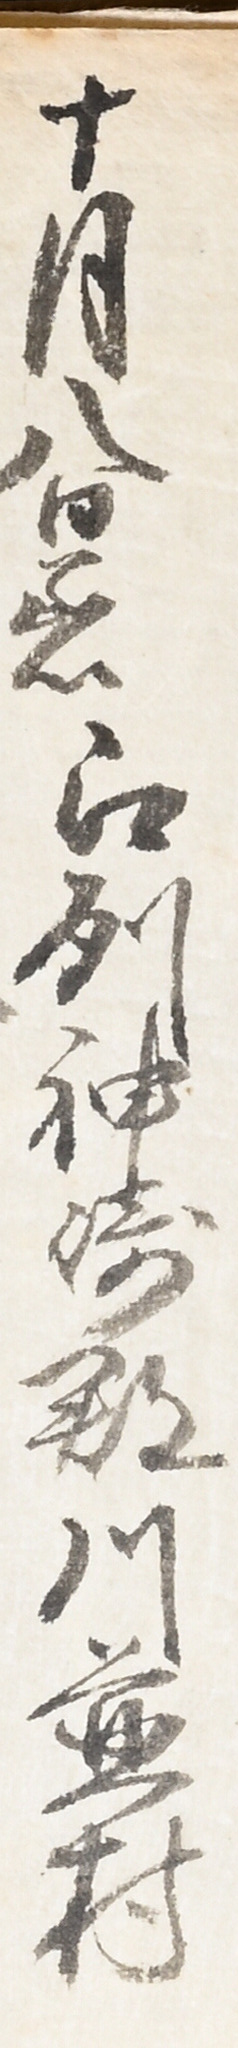十月八日着江州神崎郡川並村
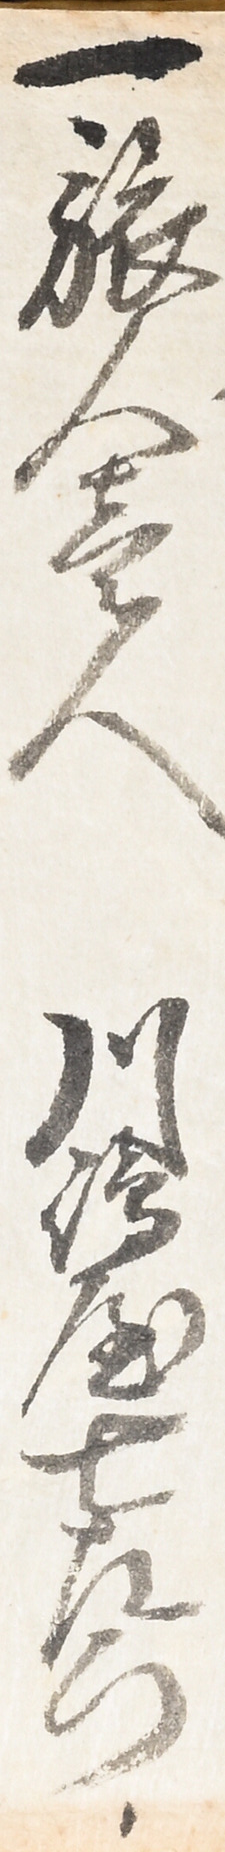一旅人壱人川嶋屋七左衛門・
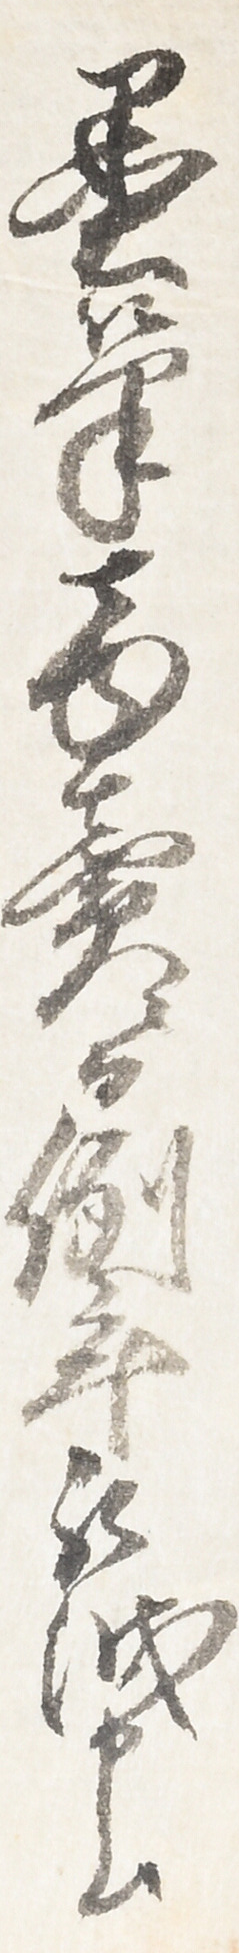墨筆商売ニ而例年罷越申候
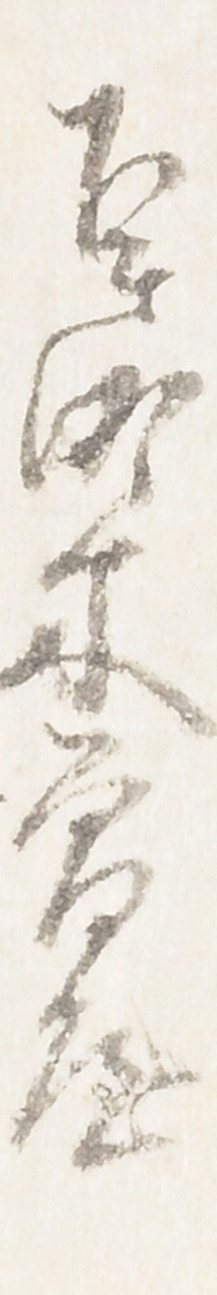下モ町木曽屋
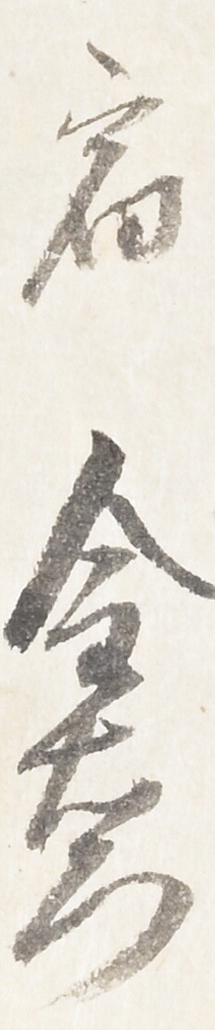宿金右衛門
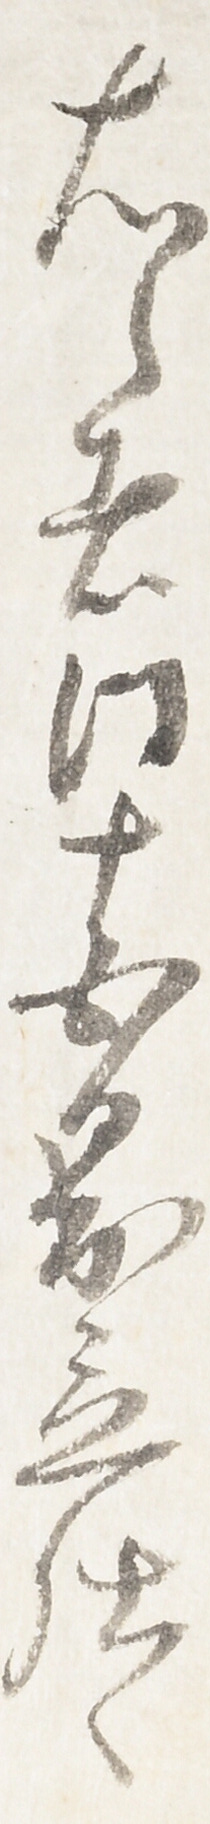右之者同十五日出立仕候
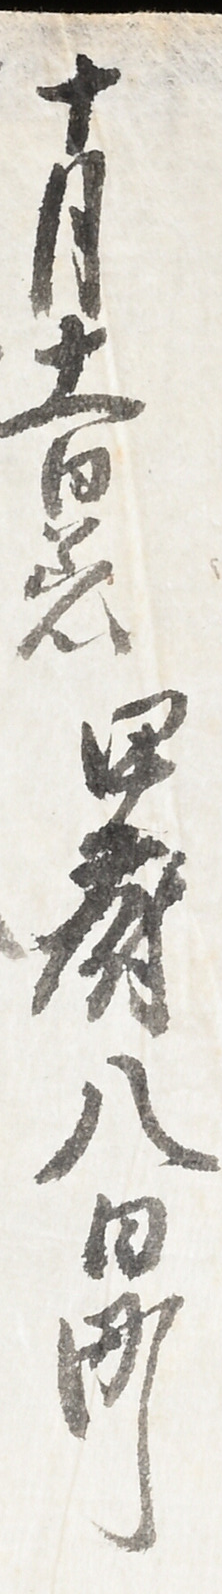十月十一日着甲府八日町
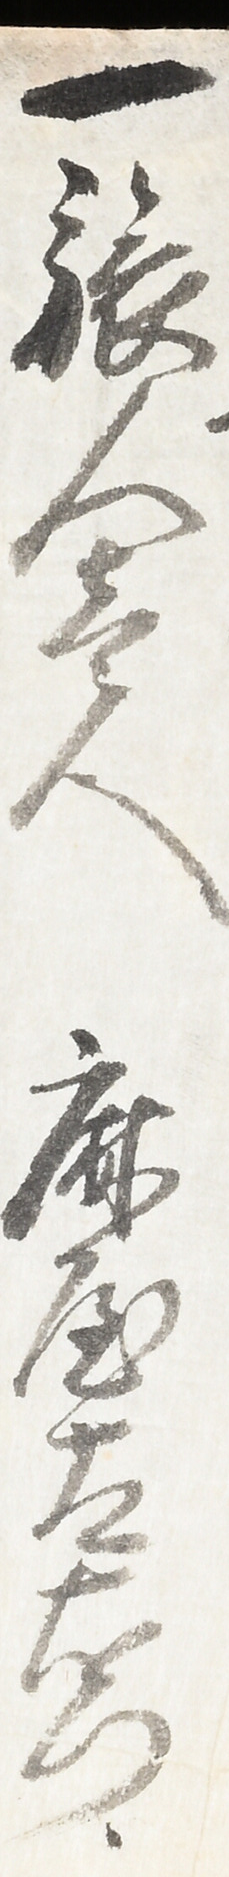一旅人壱人麻屋太右衛門・
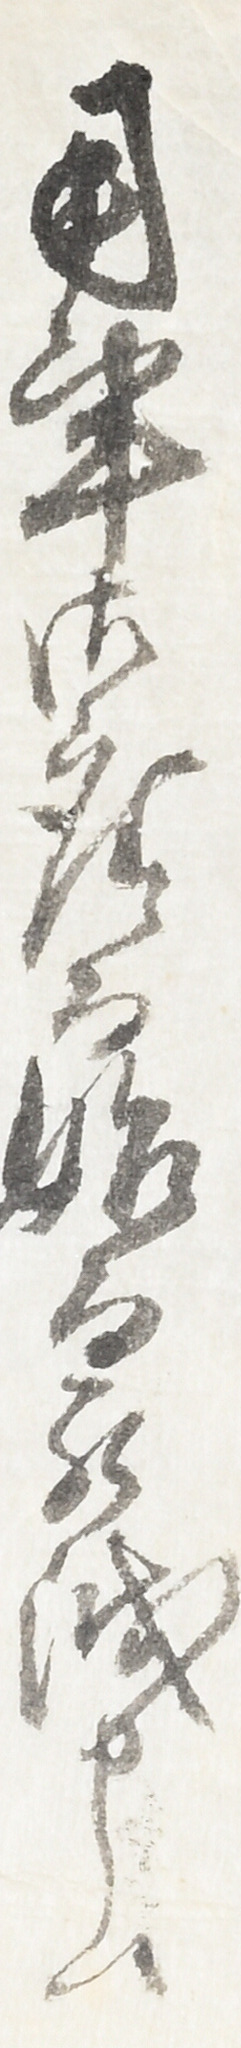用事御座候而始而罷越申候
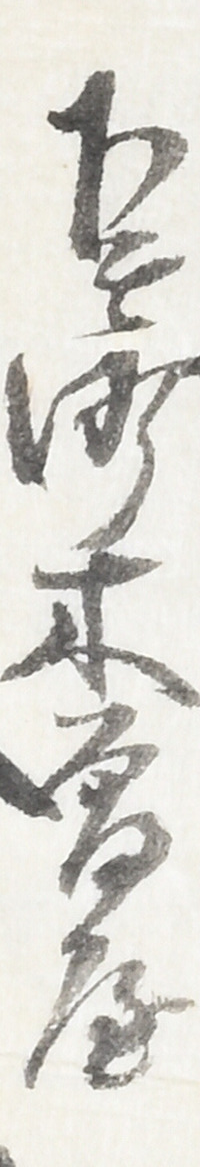下モ町木曽屋
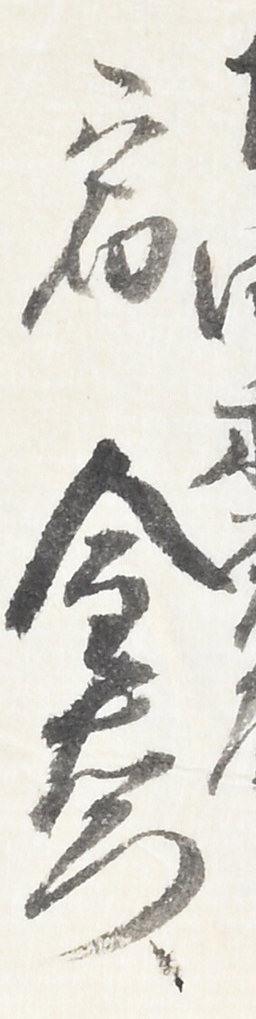宿金右衛門
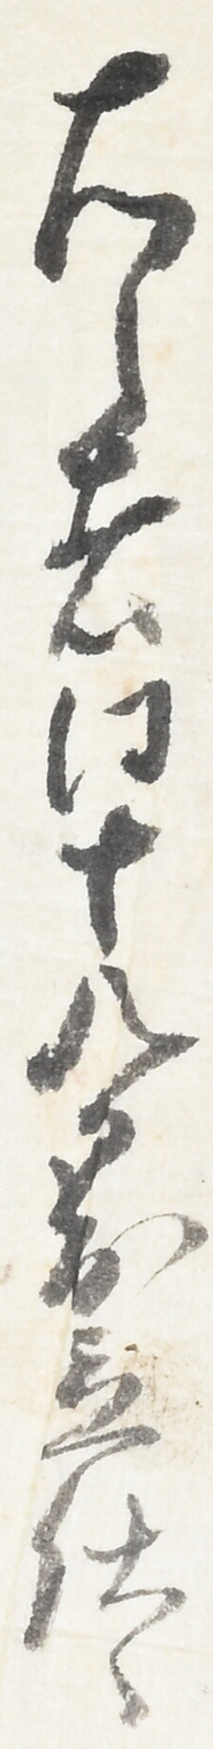右之者同十八日出立仕候
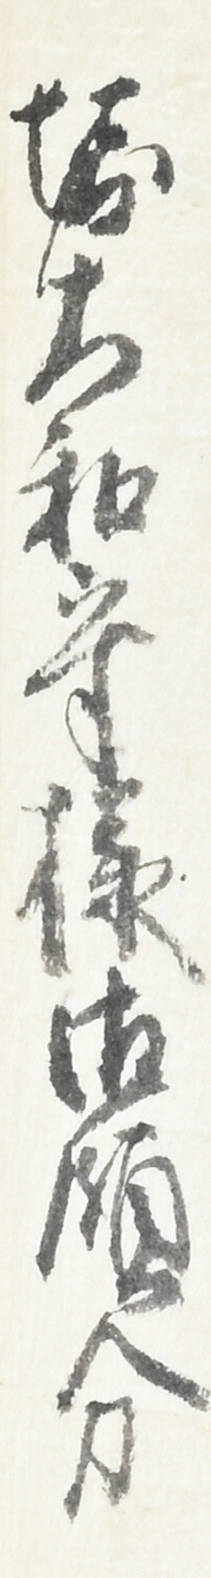堀大和守様御領分
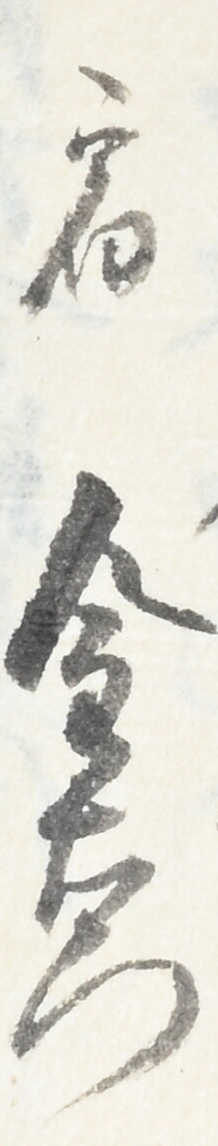宿金右衛門

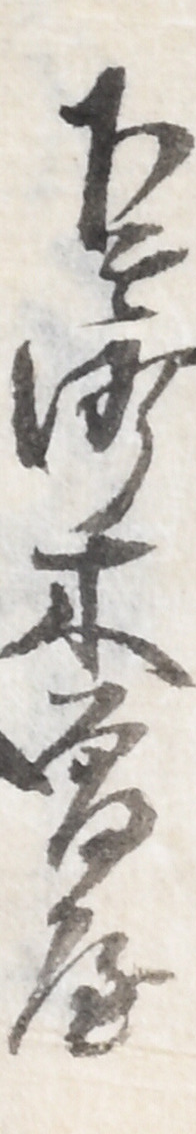下モ町木曽屋
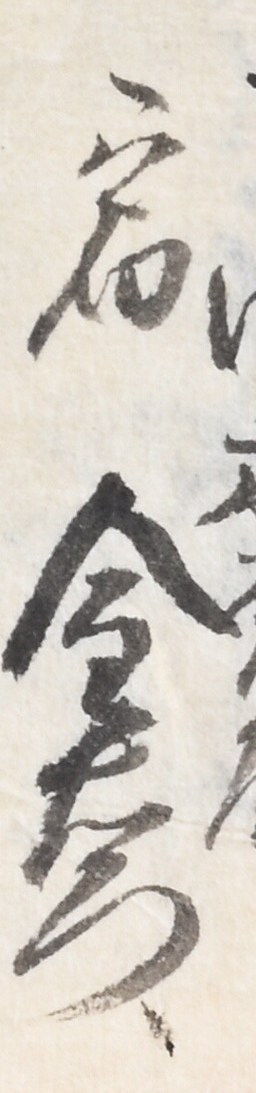宿金右衛門
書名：旅人泊控帳
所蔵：伊那市立高遠町図書館・合同会社AMANE
